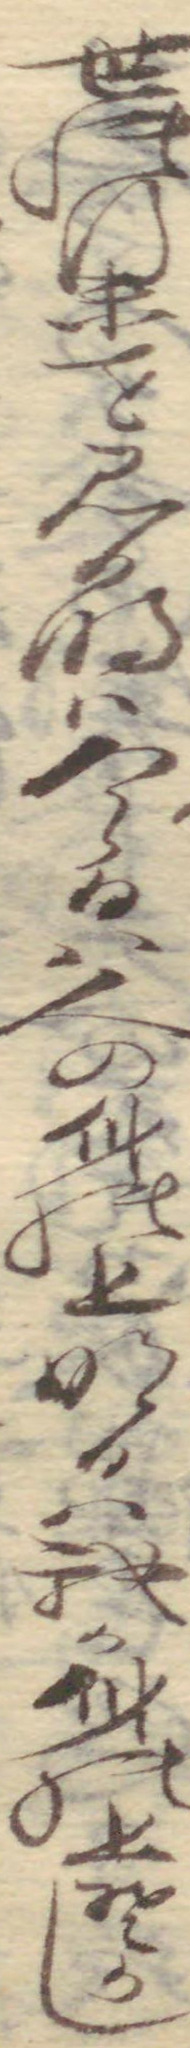世の行末を見る時は今日は人の身の上明日は我か身の上そかし
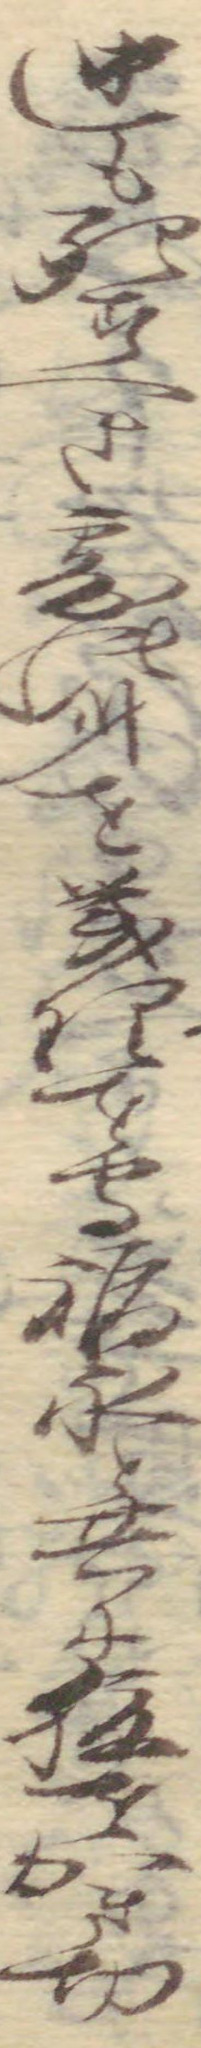迚も死すへき露の身を義理を守福永と共に腹をかき切
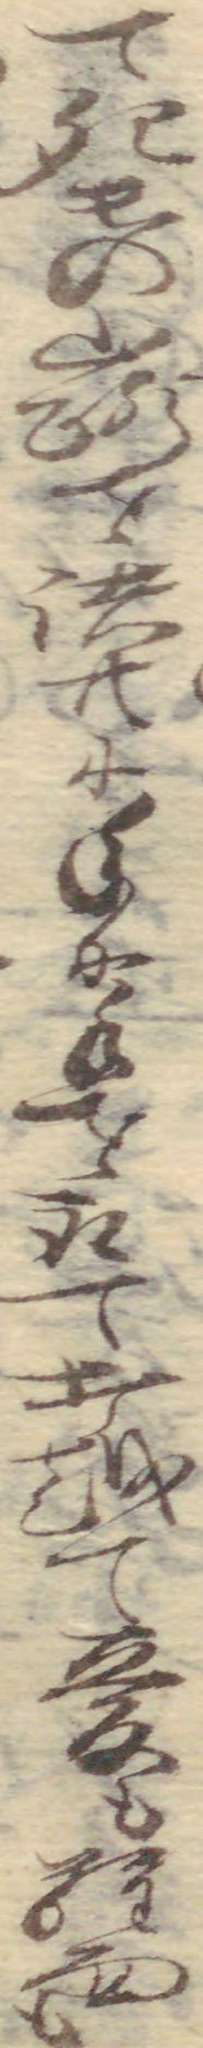て死出の山路を諸共に手に手を取て打越て立反も難面も
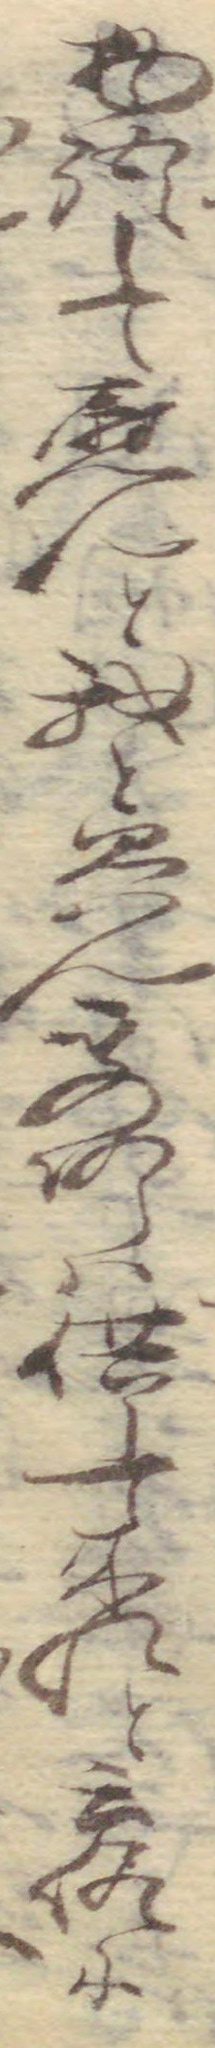物語して慰んと我と思はんものあらは供して来れと云儘に
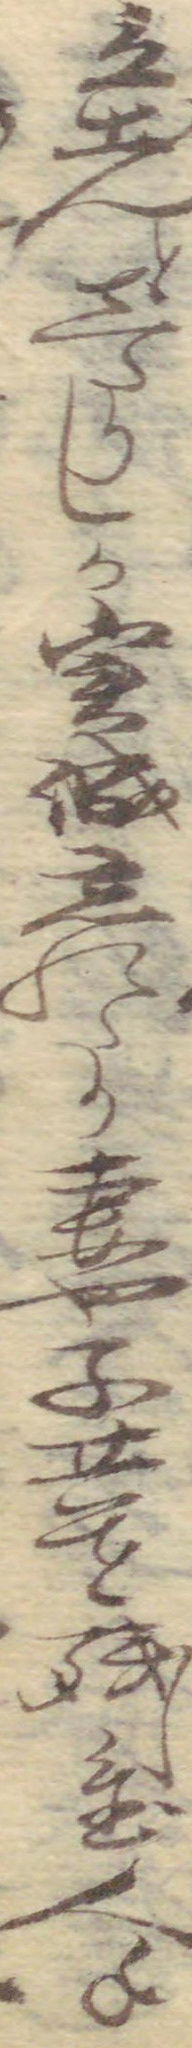立出んとしたりしか実誠忘れたり妻や子共を残し置人手
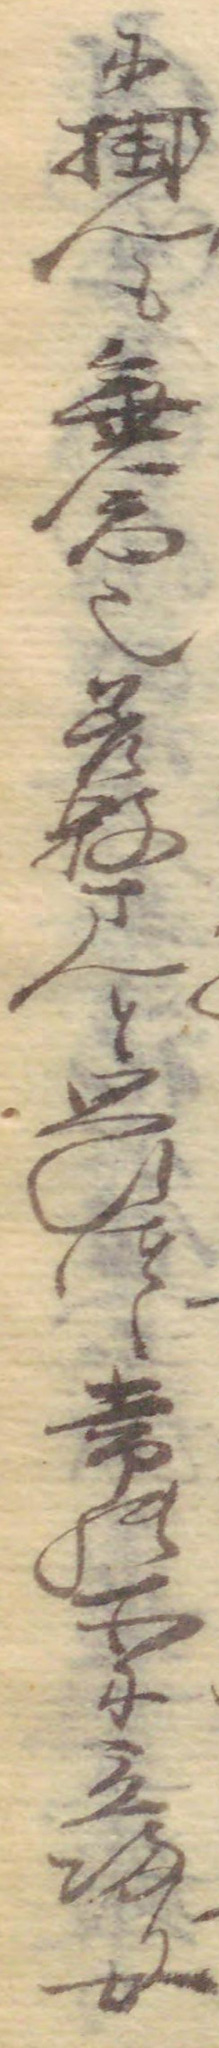に掛んも無念也差殺さんと思ひつゝ常の所に立帰り女

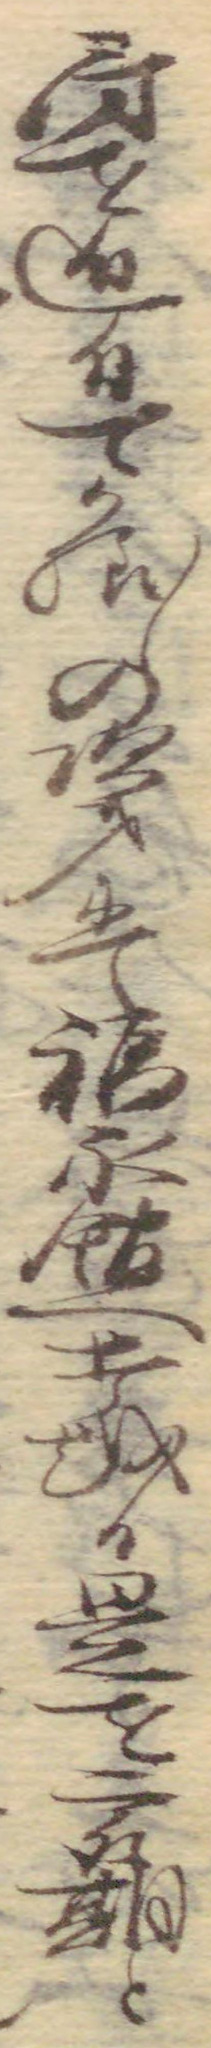房を近付てか様の次第にて福永館へ打越る是を最期と
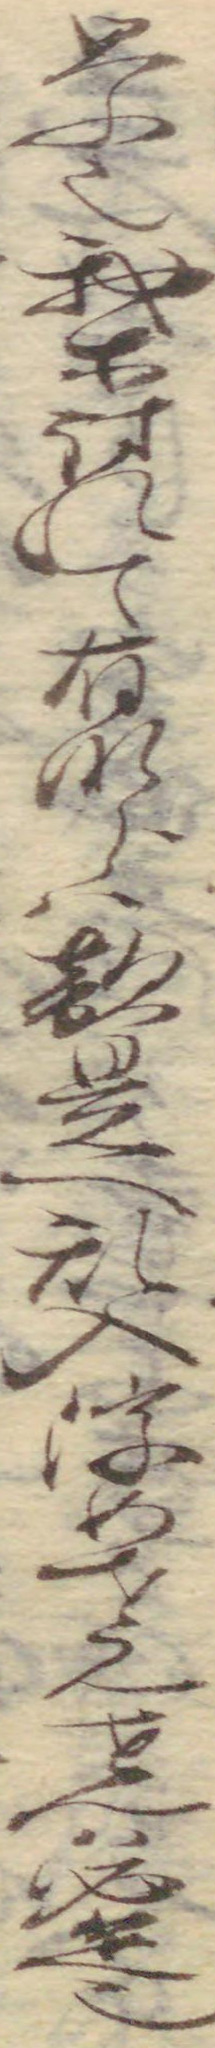思ふ也我等討れて有ならは敵是へ乱入浮めを見せんは必定也
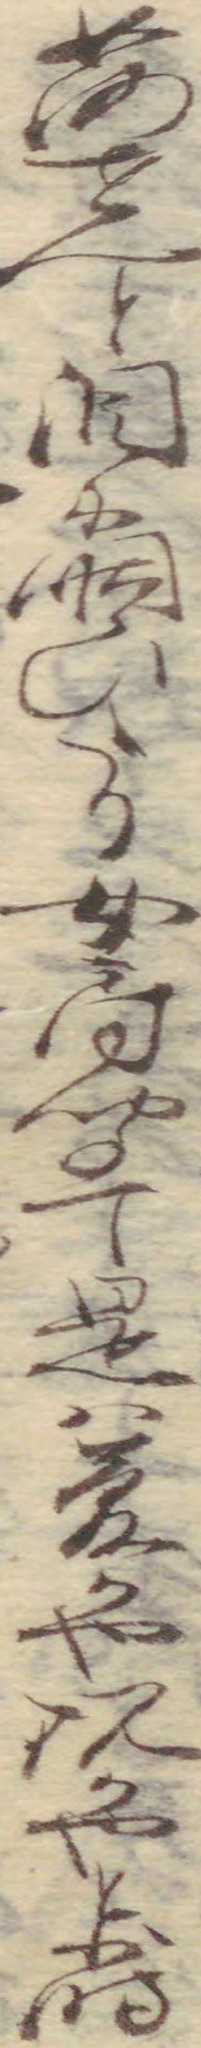如何せんと泪に咽ひたり女房聞て是は夢かや現かやと少時
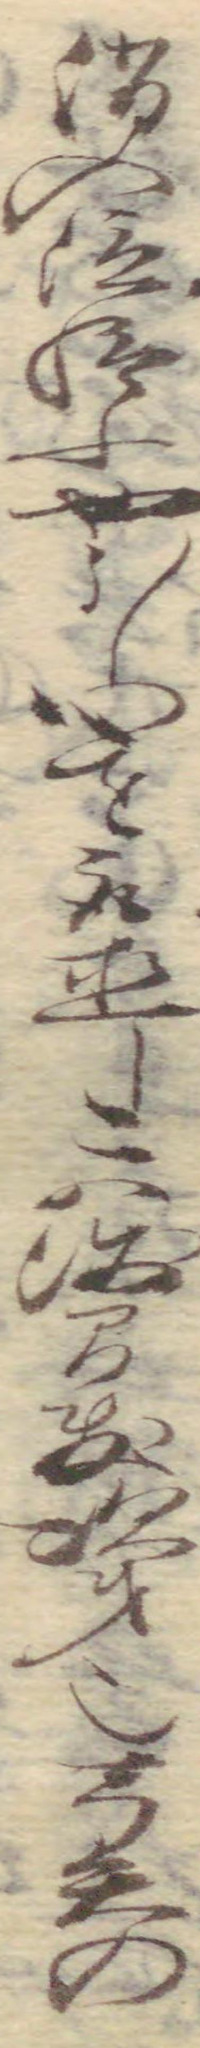消入泣給ふやう〳〵心を取直しこは浅間敷次第也弓矢の
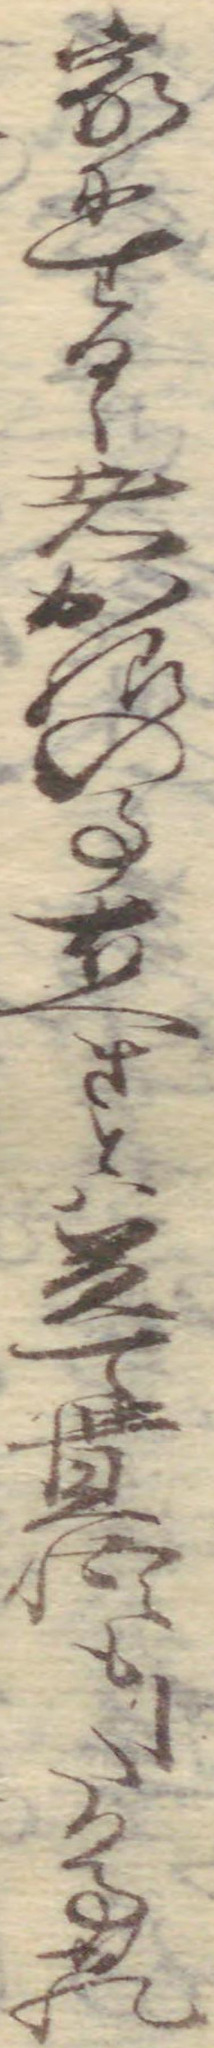家に生るゝ者か様の事有へきとは覚て覚悟もしたる事なれ
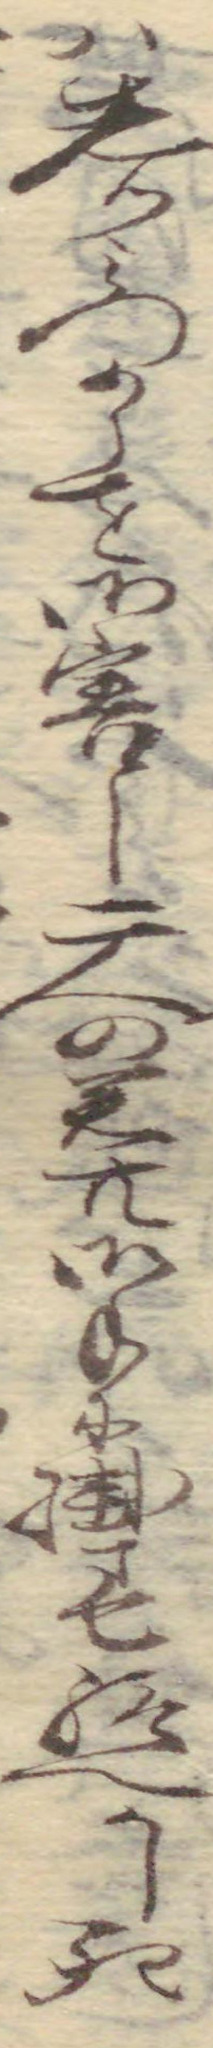は先ツみつからを御害し二人の若共御手に掛させ給へかし死
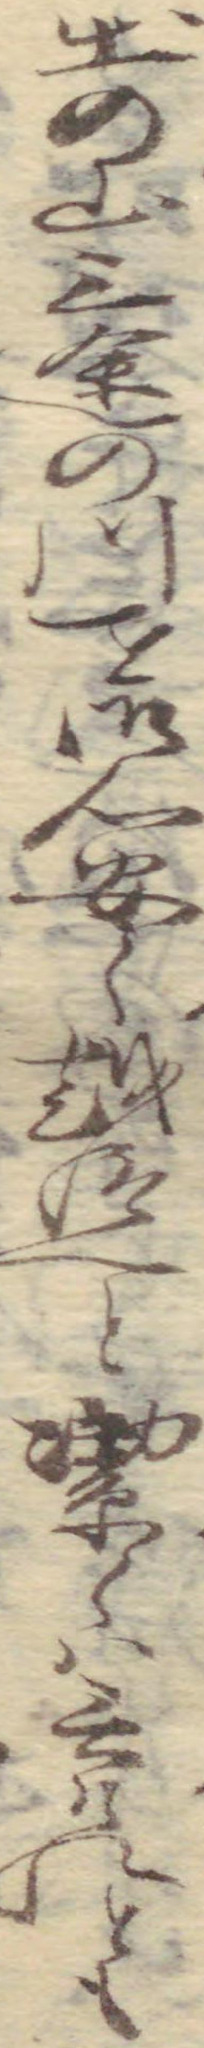出の山三途の川を御心安く越給へと潔くは言けれとも
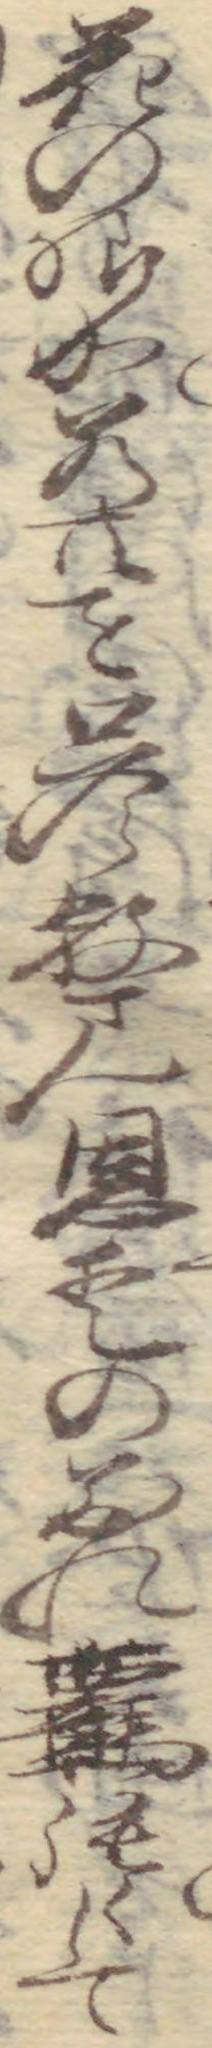花の様成若共を只今殺さん恩愛の別れ羈強くして
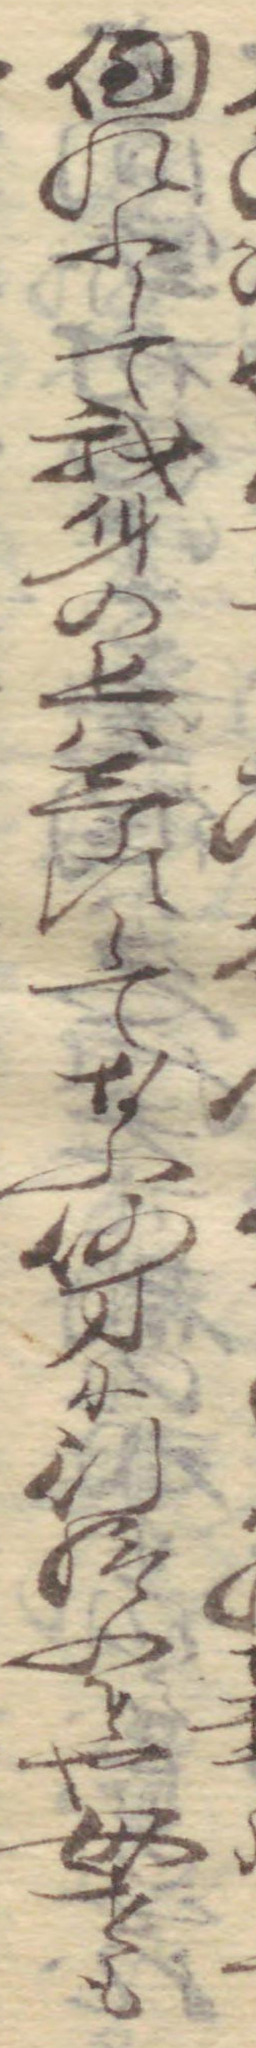倒れふして我身の上はしらすしてなふ何方に行給ふそや母をも
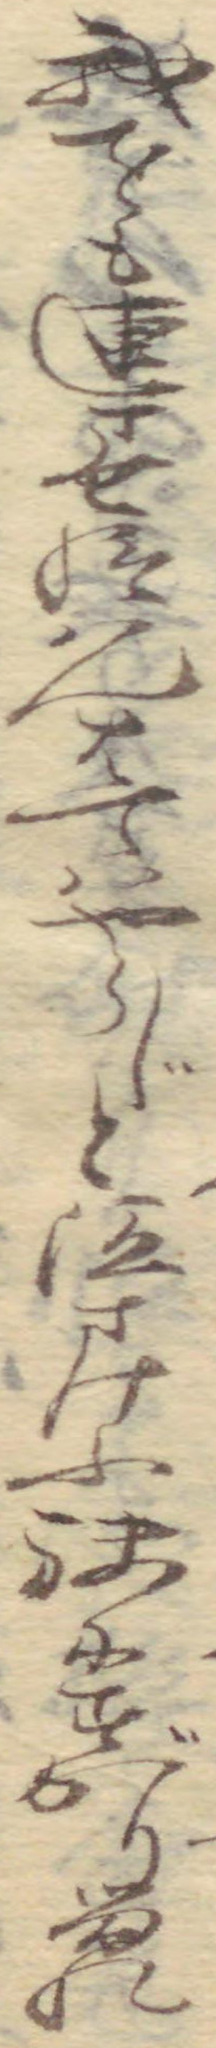我をも連させ給はんはてはやらじと泣さけふ袂にすがり留れ
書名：鶯宿雑記. 巻199-200
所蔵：国立国会図書館 National Diet Library, JAPAN
